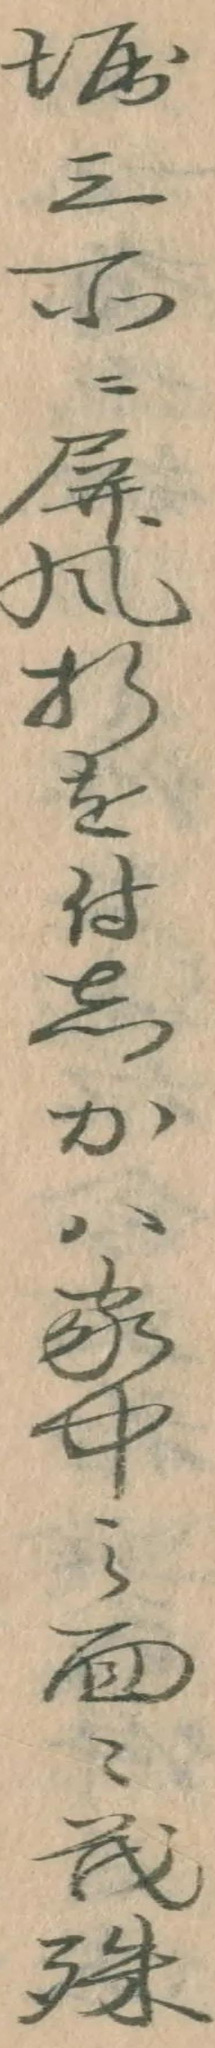堀三所に屏風折を付志かは家中之面々茂殊
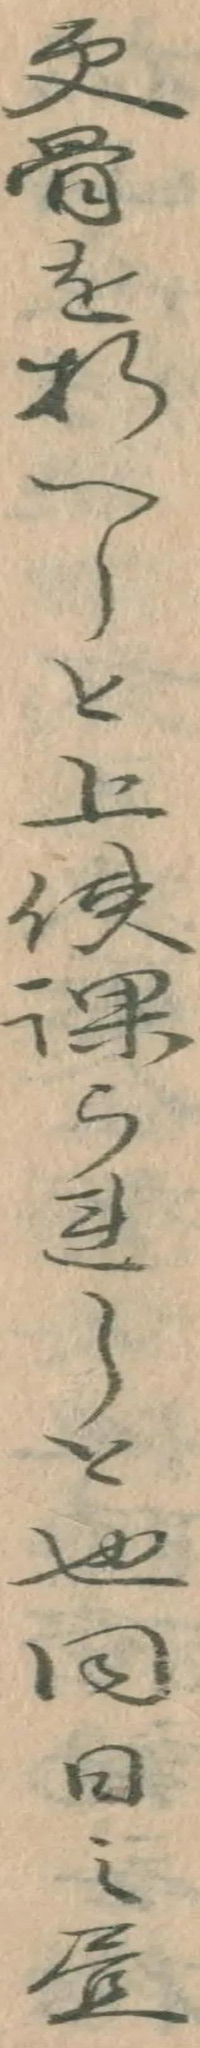更骨を折へしと上使課ら連しと也同日之昼
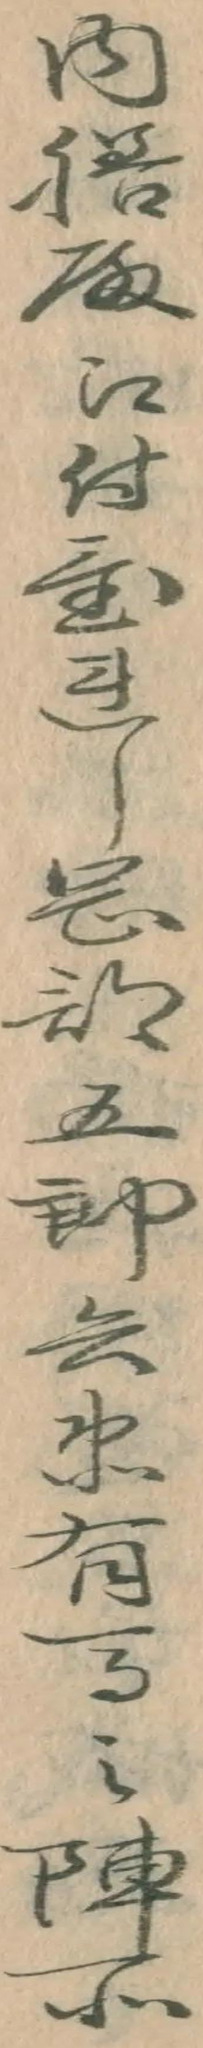内膳殿江付置連し岡部五郎兵衛有馬之陣所

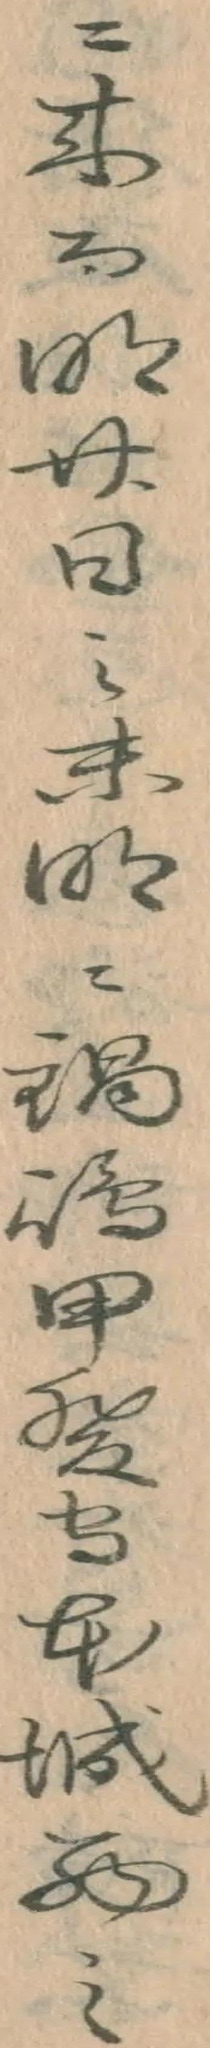に来而明廿日之未明に鍋島甲斐守本城西之
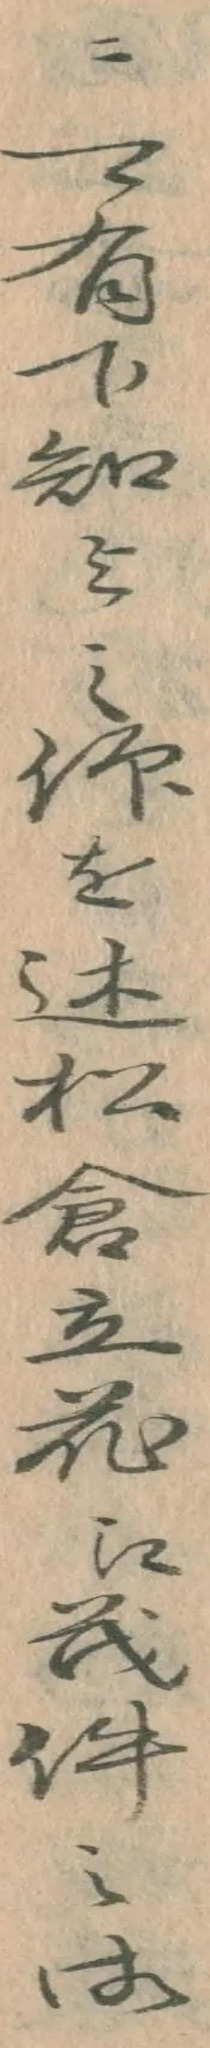に可有下知与之仰を述松倉立花江茂件之御
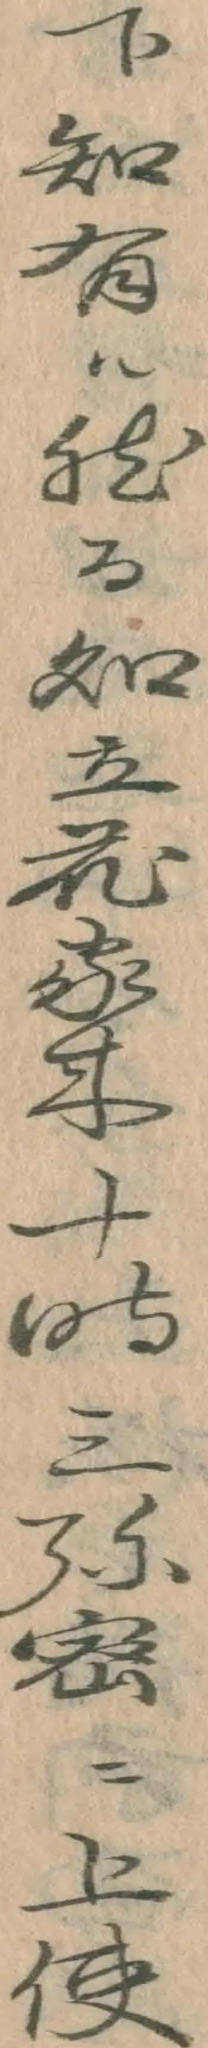下知有候然る処立花家来十時三弥密に上使
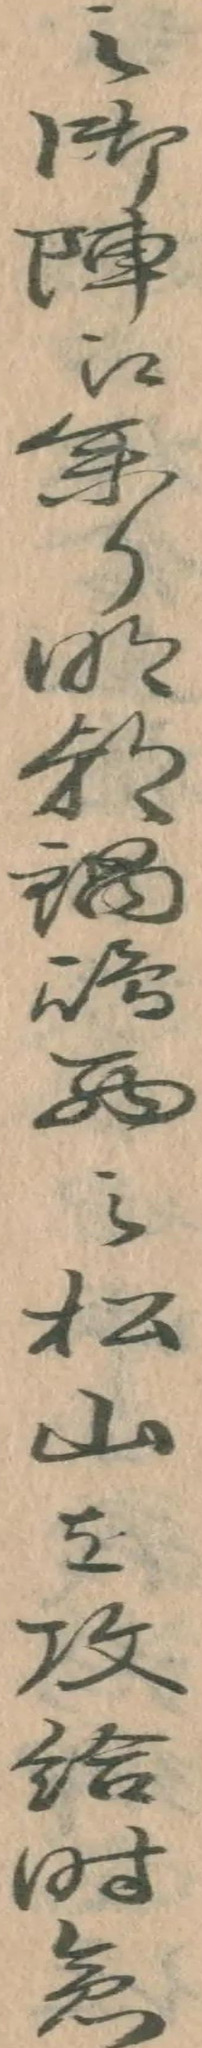之御陣江参り明朝鍋島西之松山を攻給時急
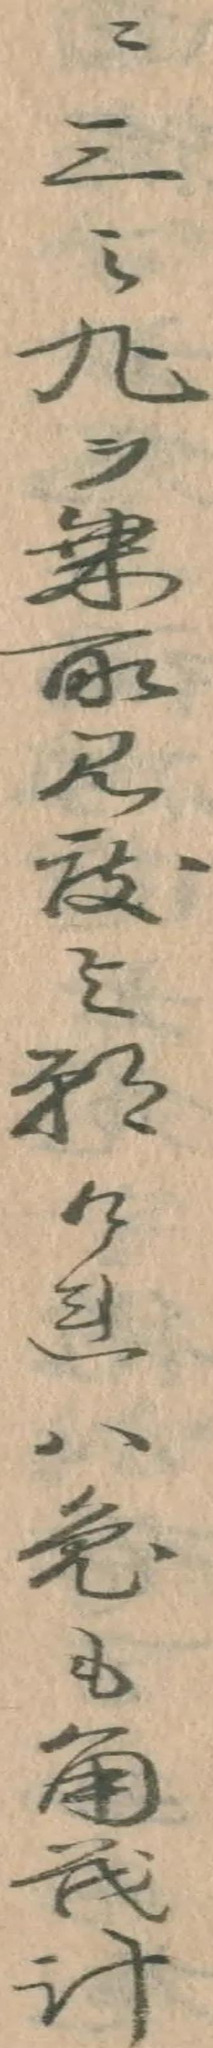に三之丸を乗取見度与願け連は兎も角茂斗
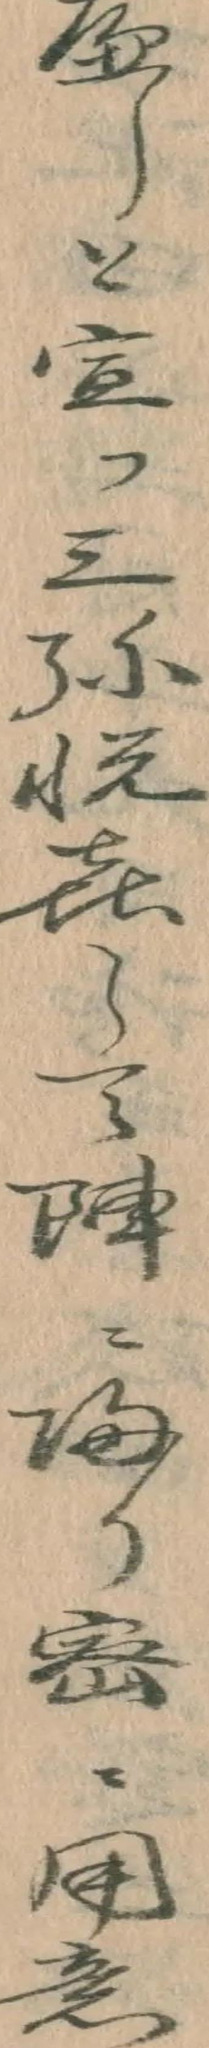扁しと宣ふ三弥悦喜して陣に帰り密に用意
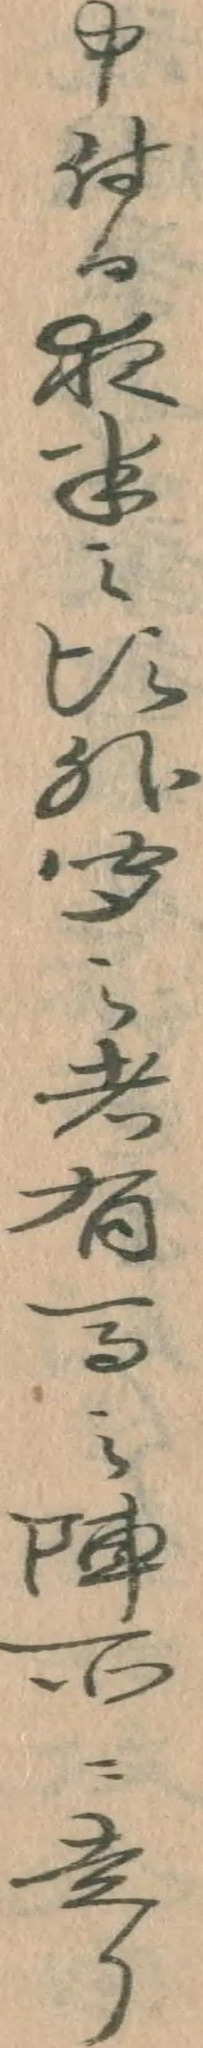申付る夜半之頃外聞之者有馬之陣所に走り
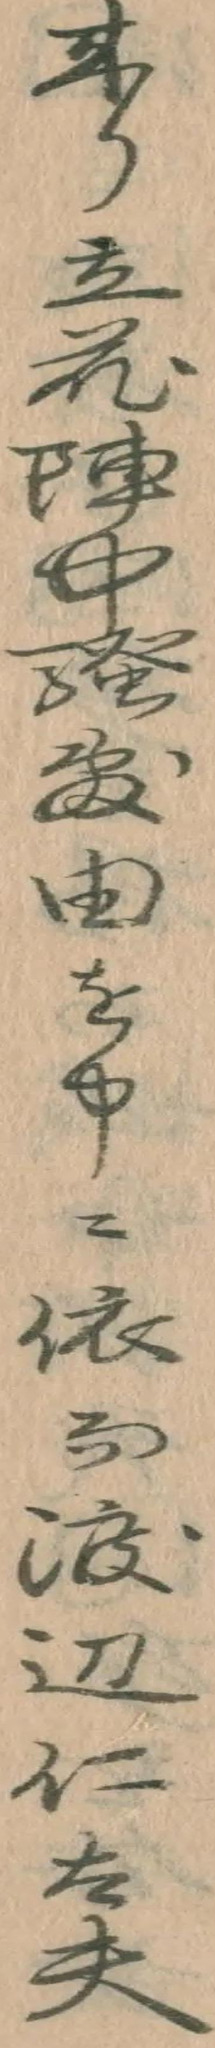来り立花陣中騒敷由を申に依而渡辺仁太夫
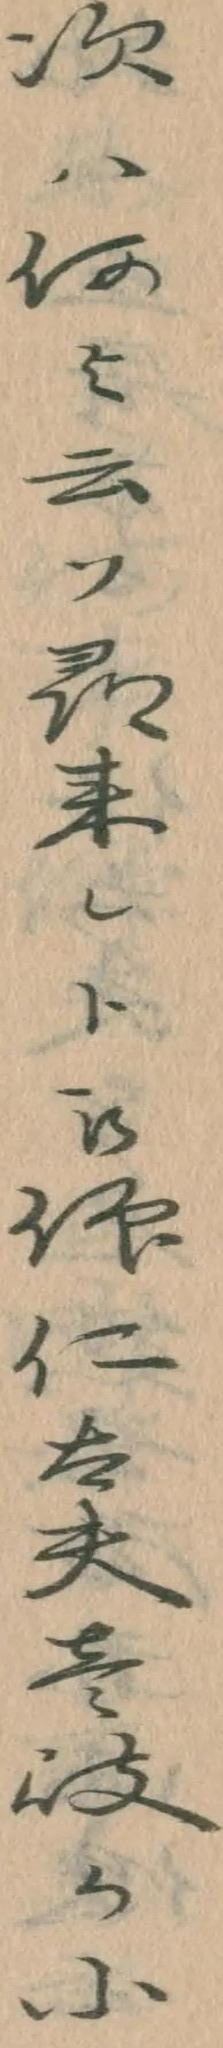次は何与云ふ尋来れと被仰仁太夫壱岐か小
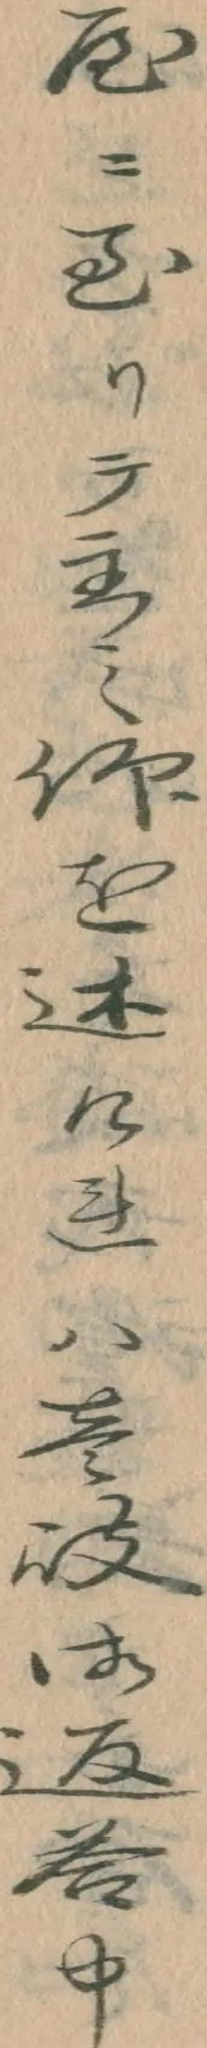屋に至りて主之仰を述け連は壱岐御返答申
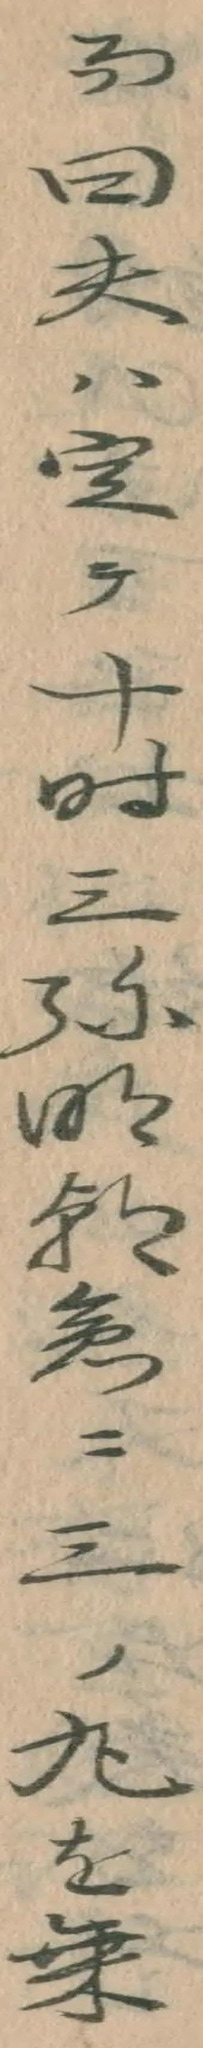而曰夫は定て十時三弥明朝急に三之丸を乗
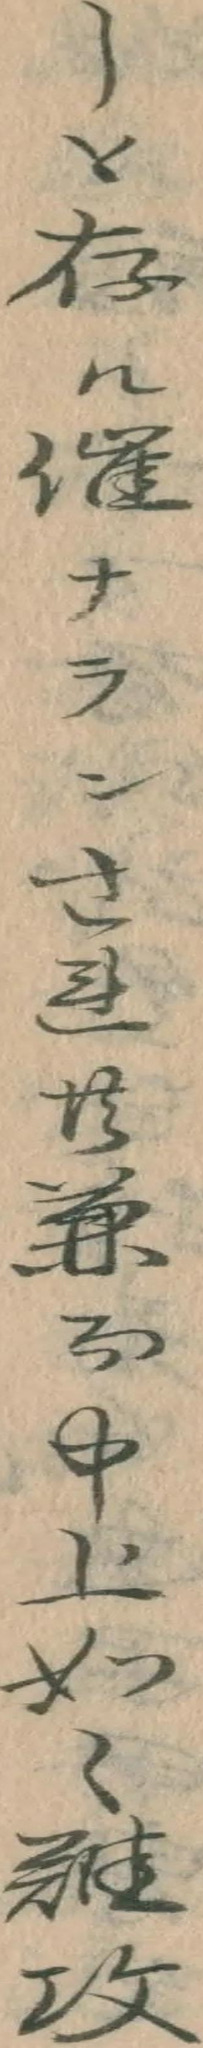しと存る催ならんさ連共兼而申上如く難攻
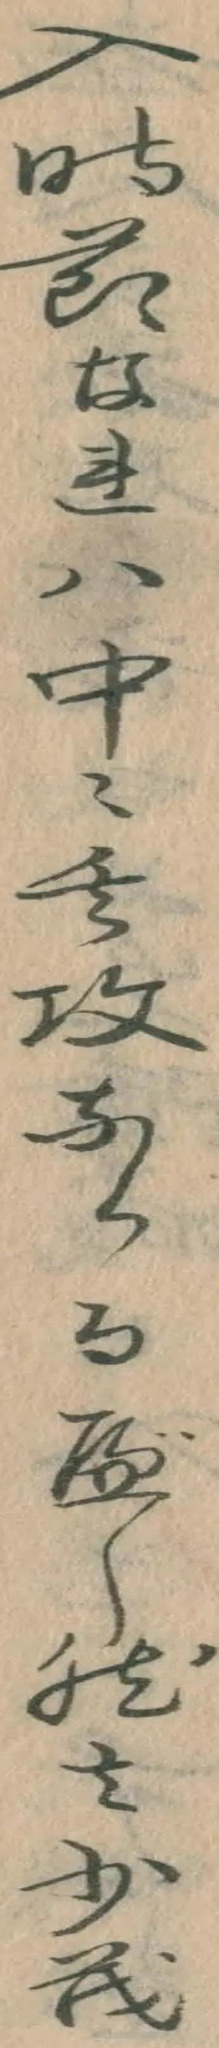入時節な連は中々其攻なかる扁し然者少茂
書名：切支丹御退治記 49巻. [4]
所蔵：国立国会図書館 National Diet Library, JAPAN
